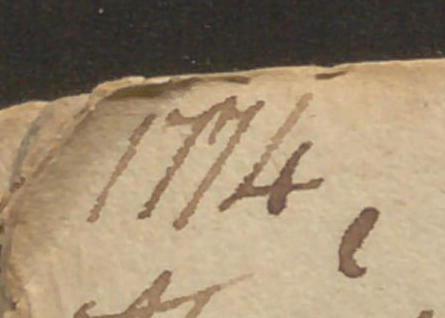1774
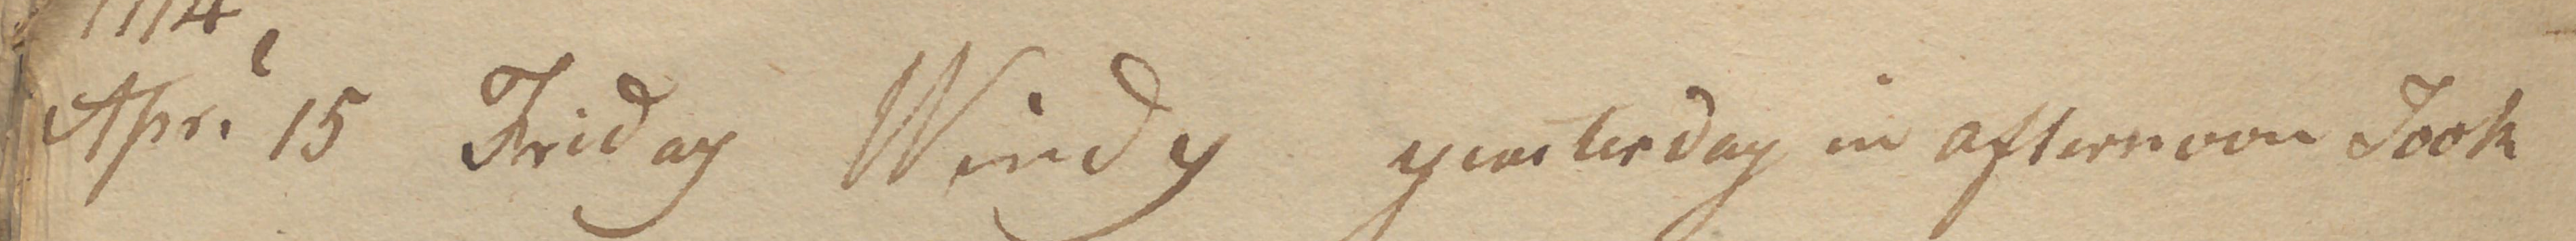Apr^l. 15 Friday Windy yeasterday in afternoon Took
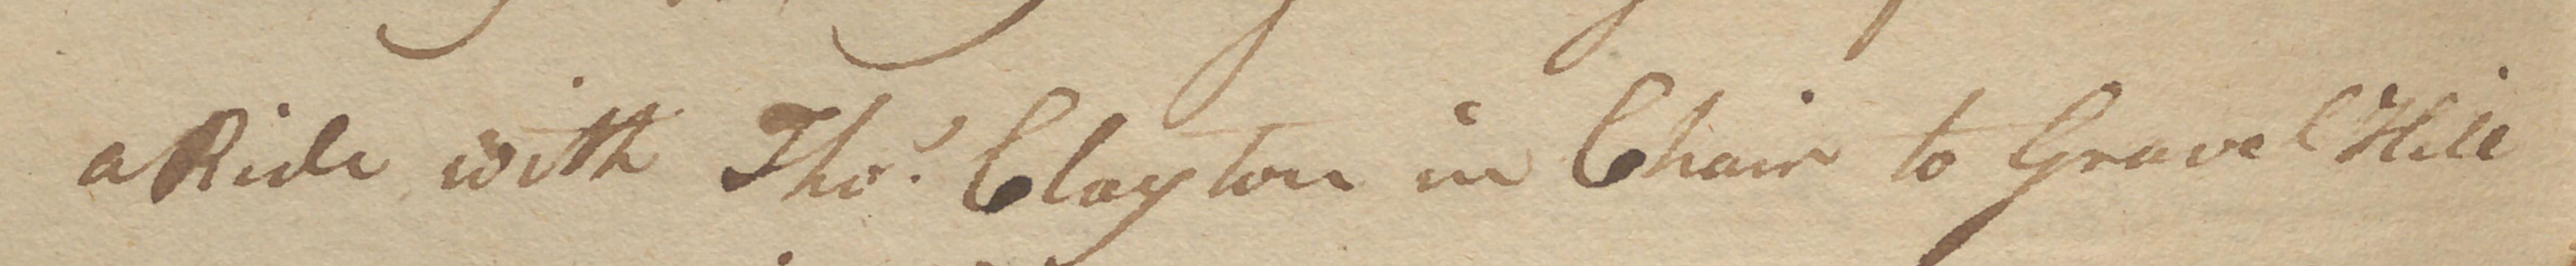a Ride with Tho^s. Clayton in Chair to Gravel Hill
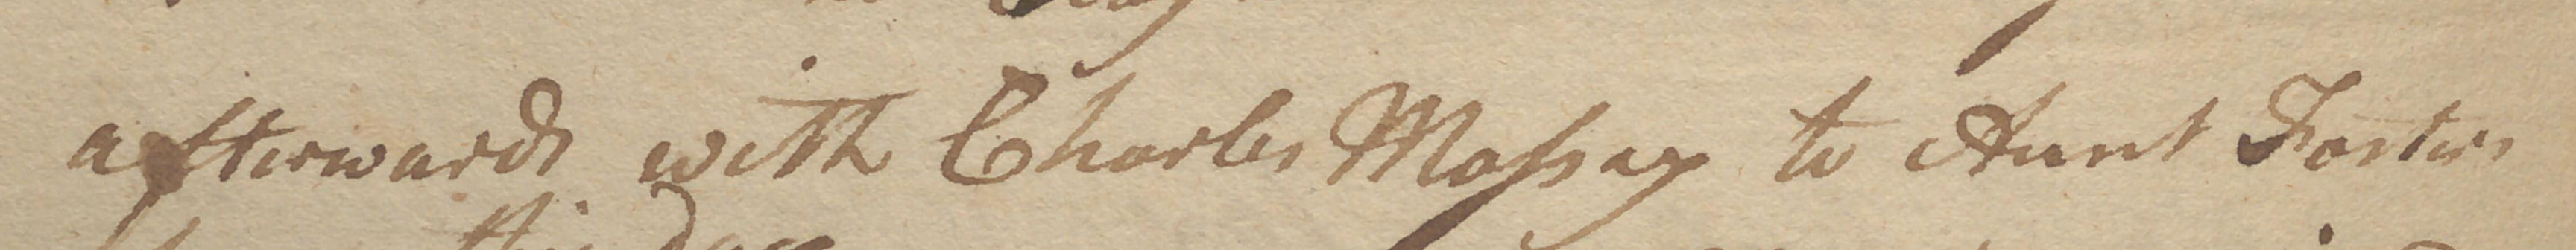afterwards with Charles Massay to Aunt Fosters
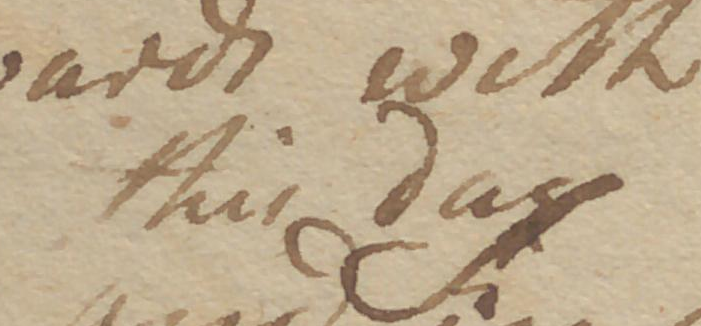this day
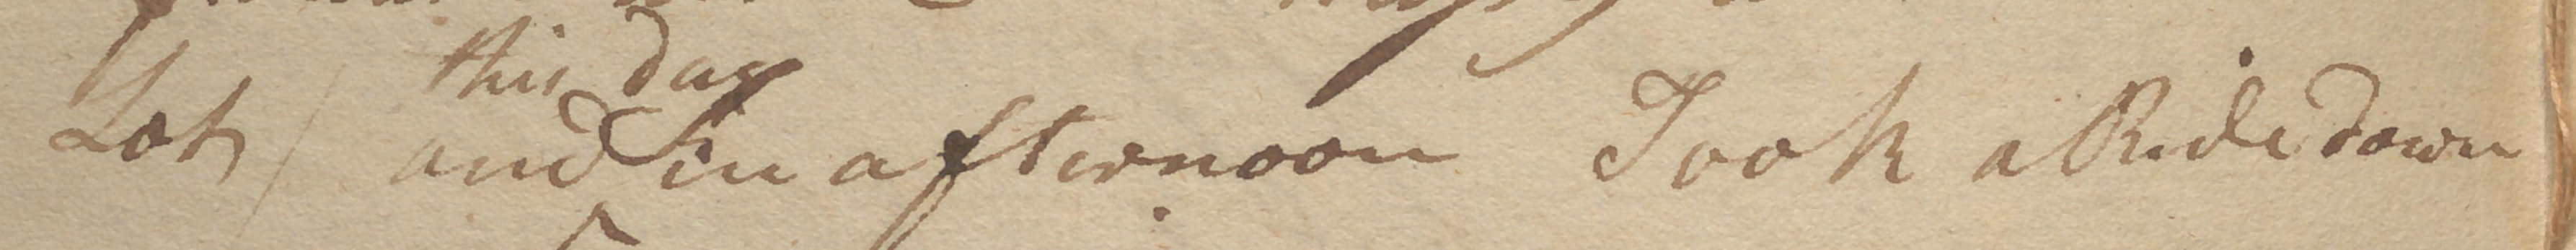Lot, and ^ in afternoon Took a Ride down
